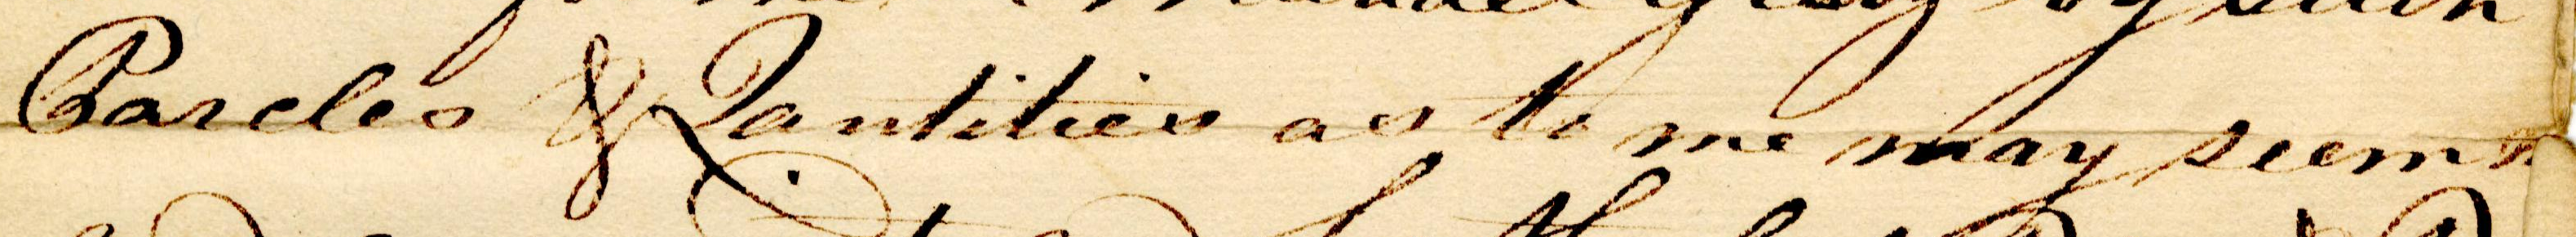Parceles & Quantities as to me may seem
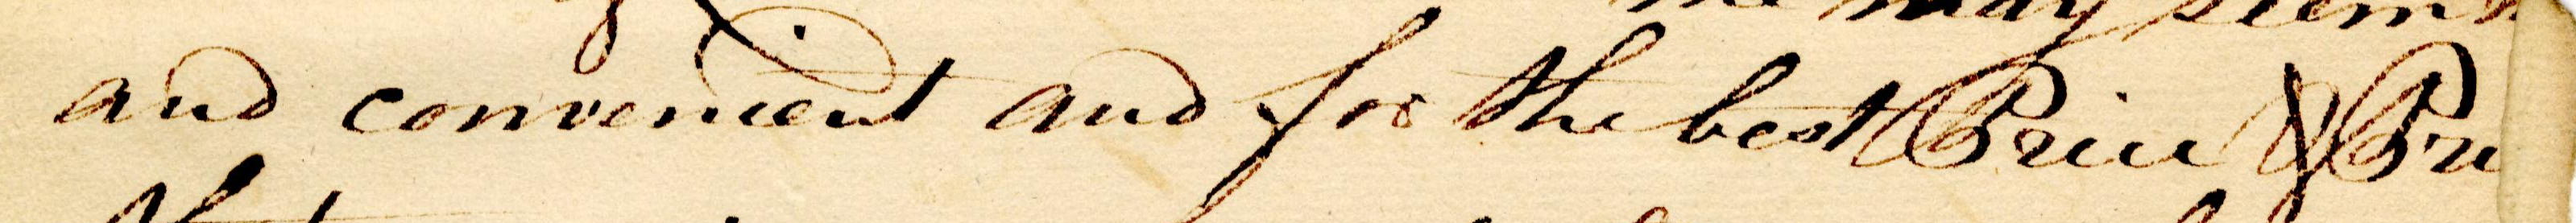and convenient and for the best Price & Pre
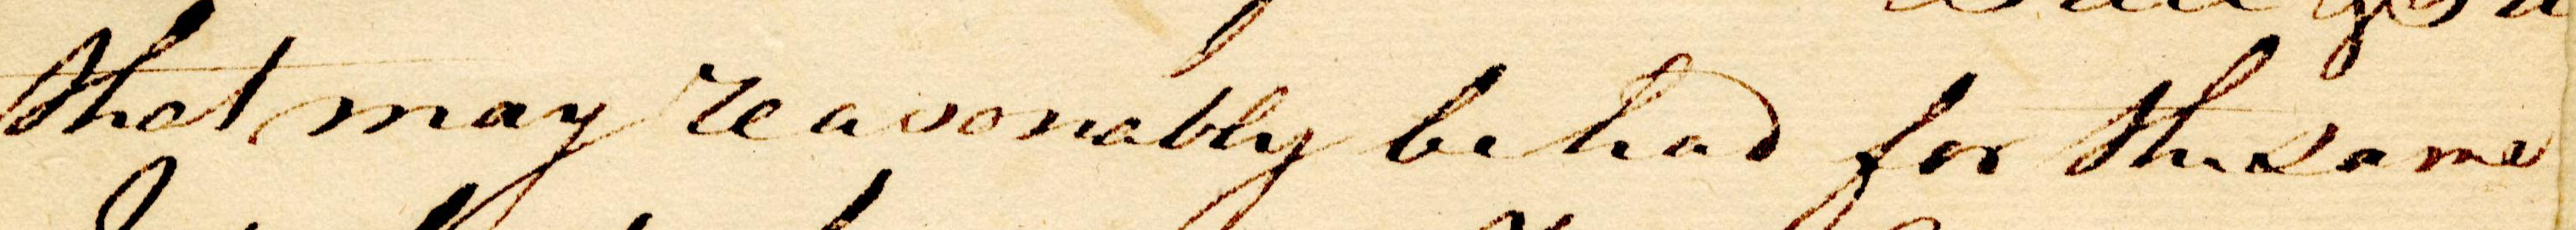that may reasonable be had for the same
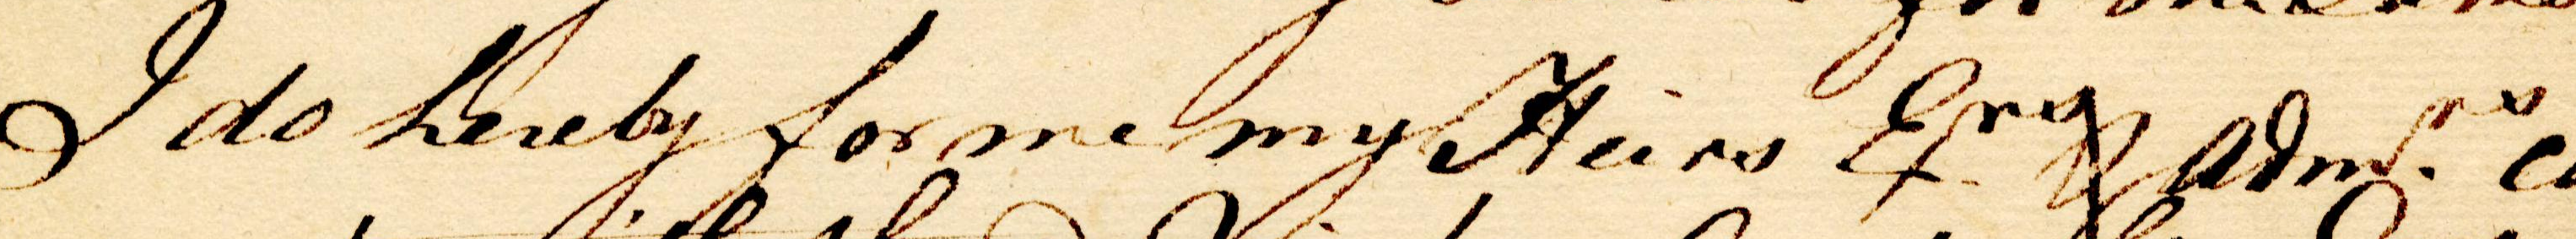I do hereby for me my Heirs E^rs. and Adm^rs:
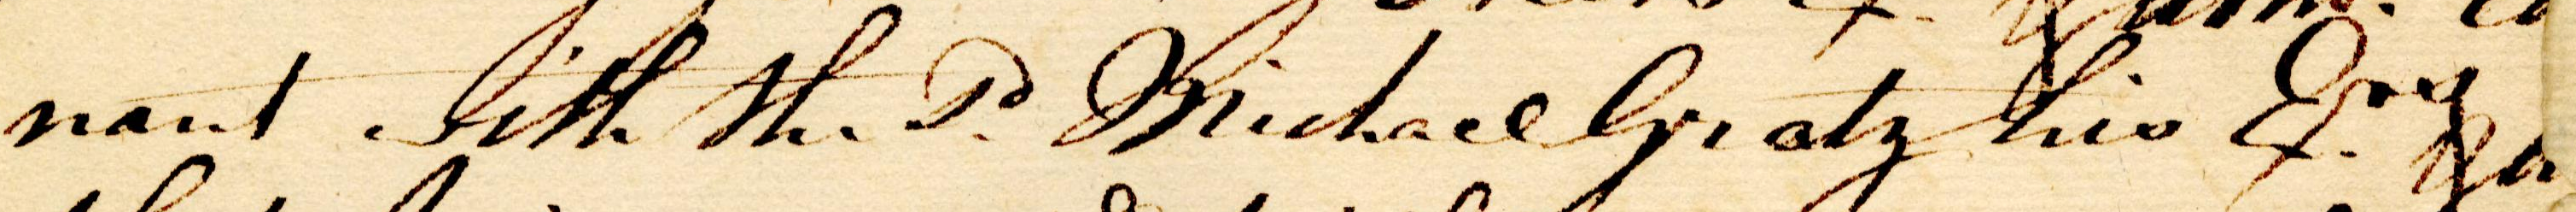-nant with the s^d. Michael Gratz his E^rs. &
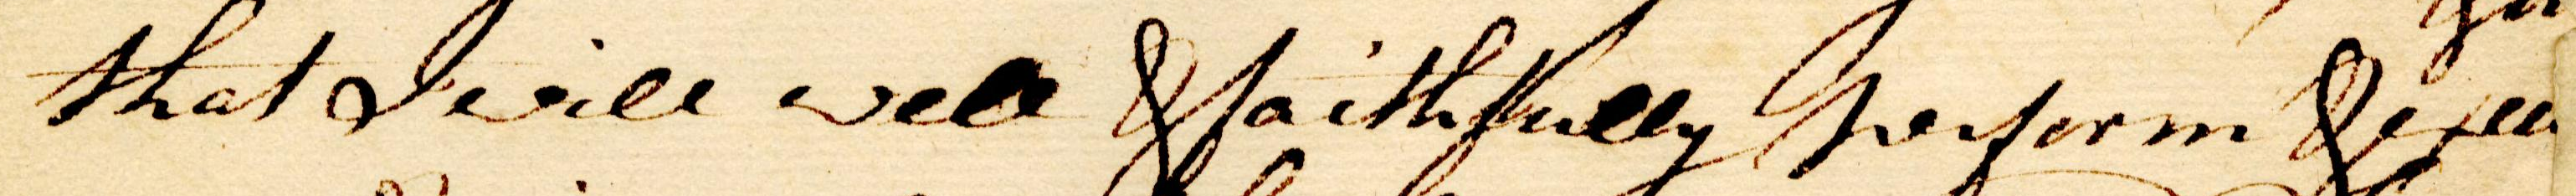that I will sell & faithfully perform & exc-
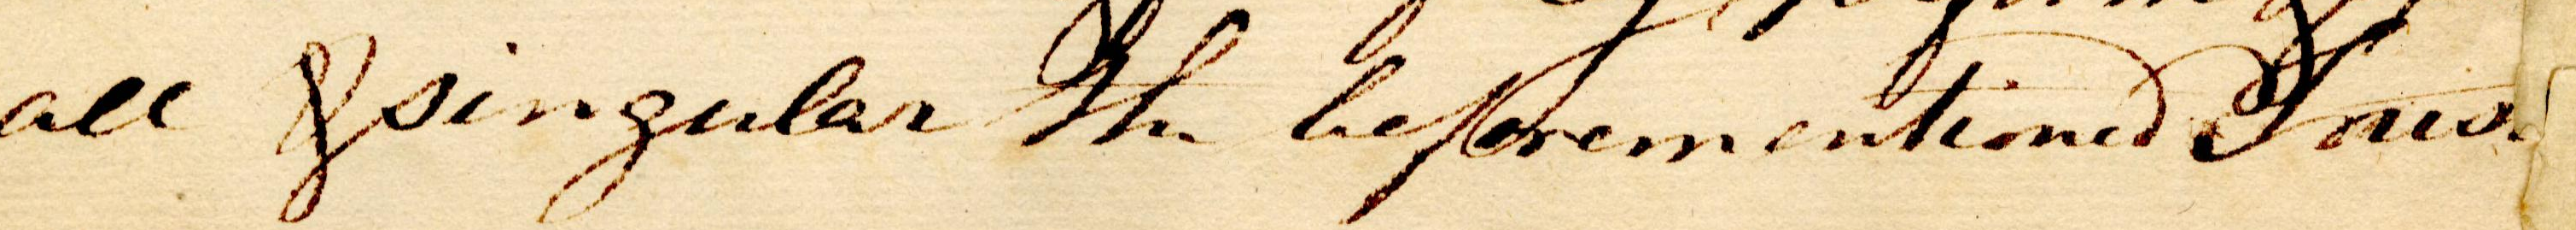all & singular the before mentioned Fav^s
